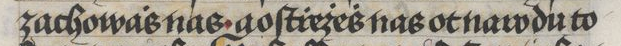zachowaṡ nas.a oſtṙeżeṡ nas ot narodu to¬
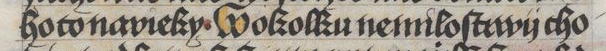hoto navieky.Wokolku nemiloſtiwij cho¬
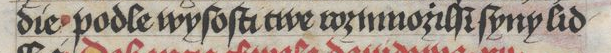die.podle wyſoſti twe rozmnożilſi ſyny lid¬
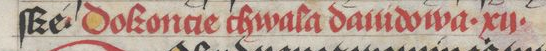ſke.Dokoncie chwala davidowa.xij.
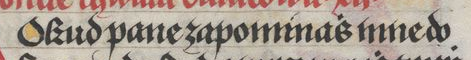Okud pane zapomínaṡ mne do
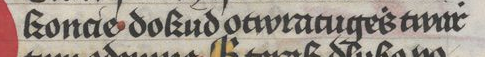koncie.dokud otwratugeṡ twaṙ
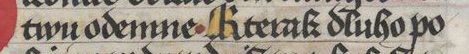twu odemne.Kterak dluho po¬
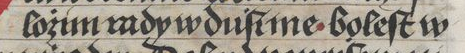ložím rady w duẛi me.boleſt w
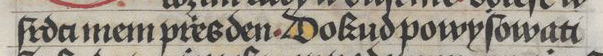ſrdci mem pṙes den.Dokud powyẛowati
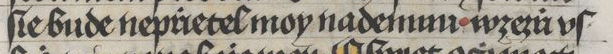ſie bude nepřietel moy nademnu.wzezři uſ¬
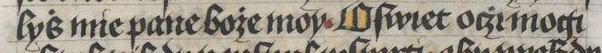lyṡ mie pane bože moy.Oſwiet ocżi mogi
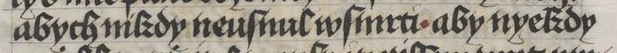abych nikdy neuſnul wſmrti.aby nyekdy
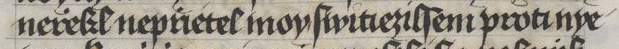neṙekl nepṙietel moy ſwitiezilſem proti nye¬
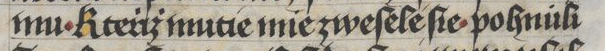mu.Kteṙiż mutíe mie zweſelé ie.pohnuli
